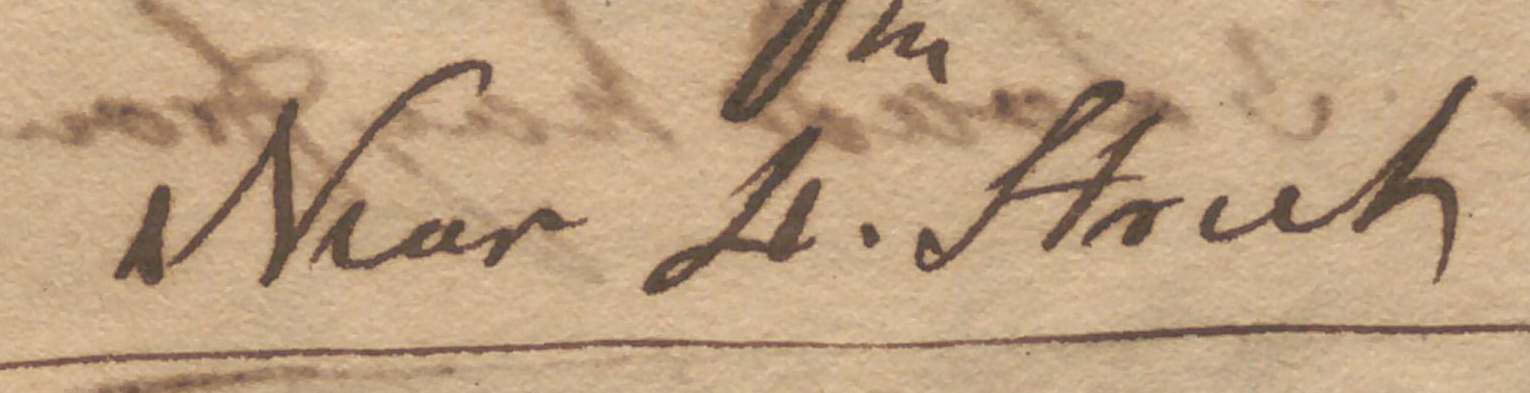Mhar 4^th. Street
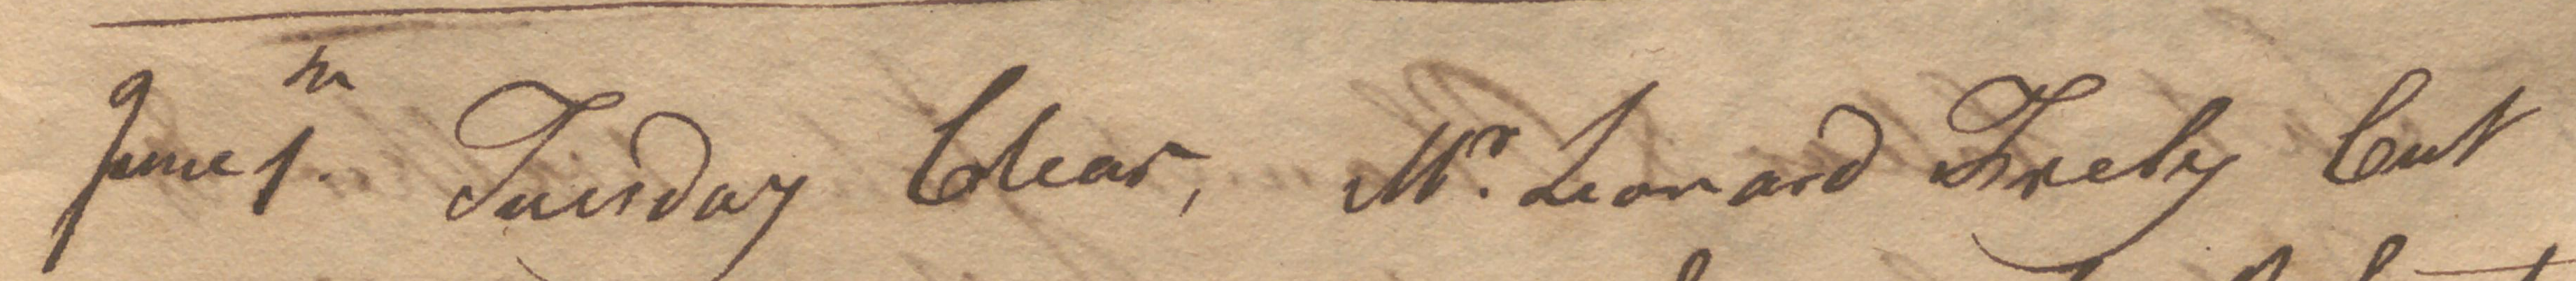June 1^th. Tuesday Clear, M^r. Leanard Frely Cut
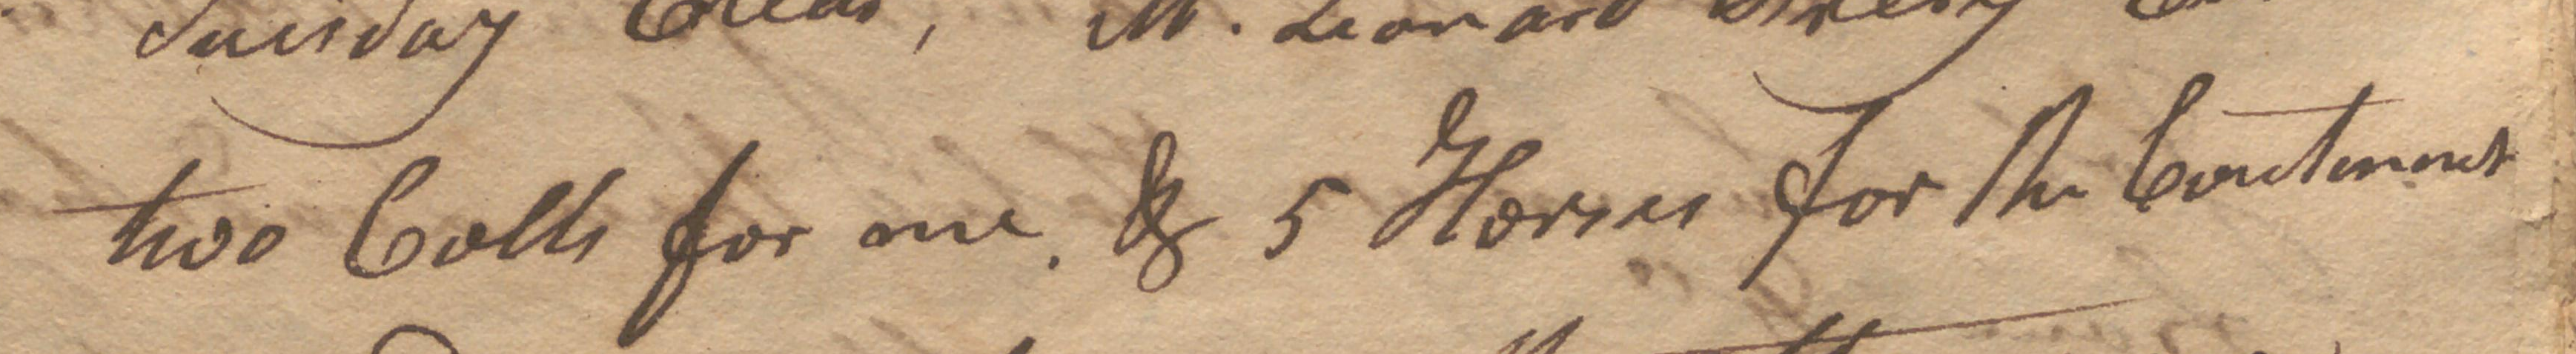two Colts for one, & 5 Horses for the Continent
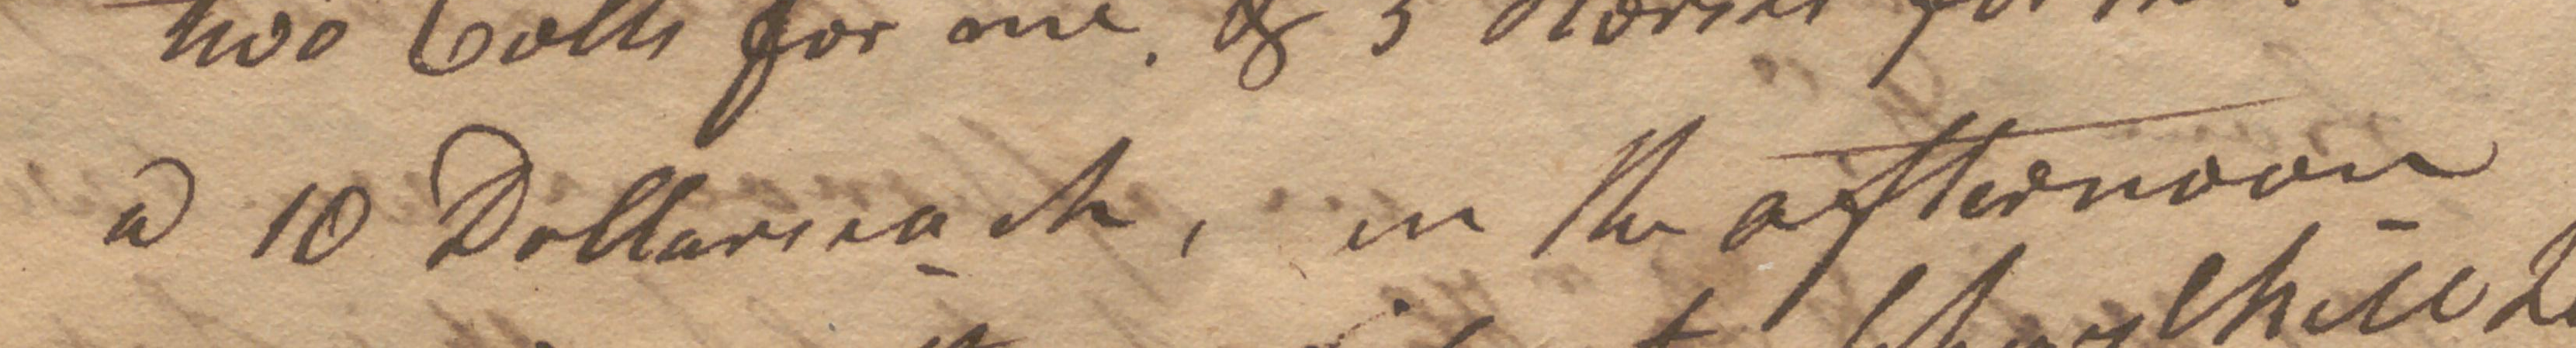@ 10 Dollars each, in the afternoon
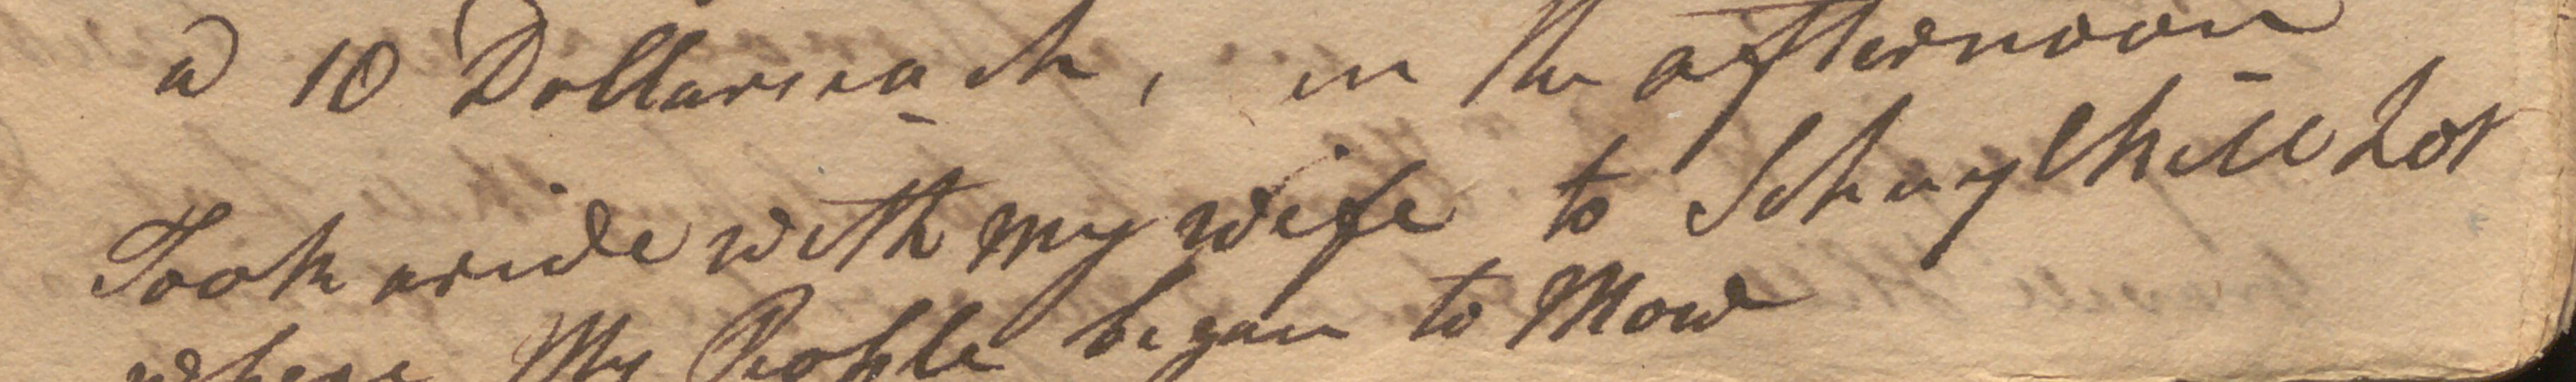Took a ride with my wife to Schuylkill Lot
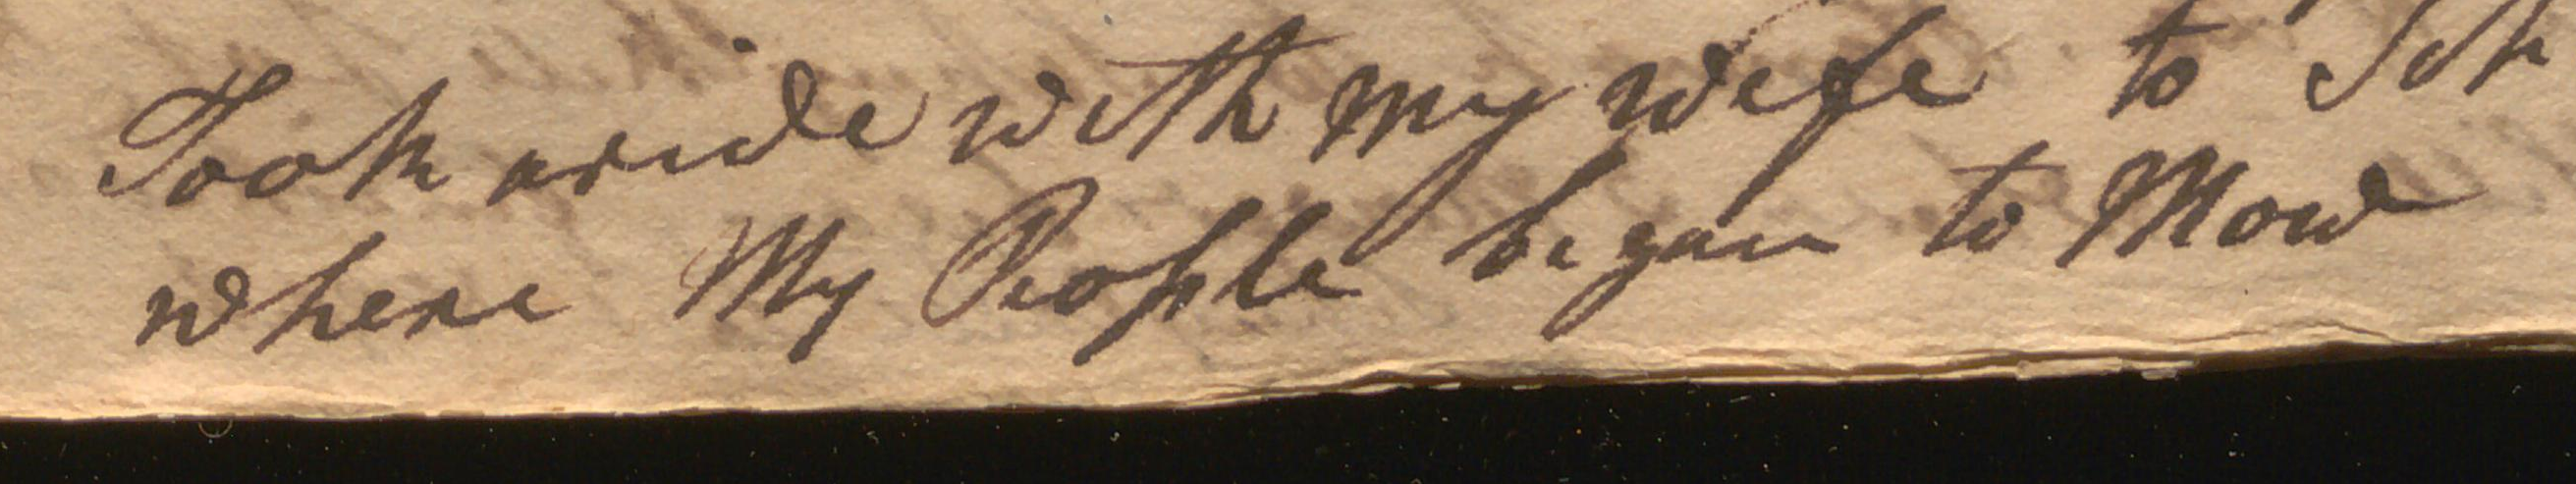where My People began to Mow
